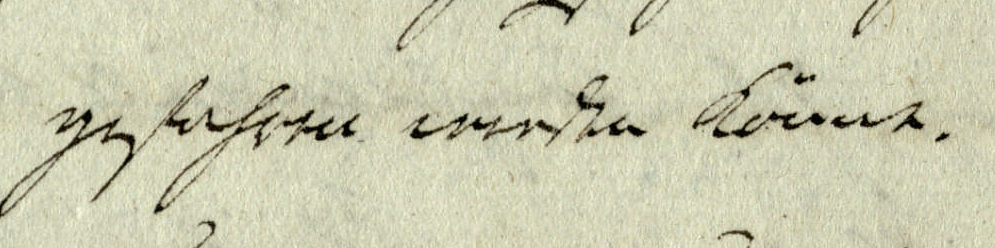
gefahren werden könne.
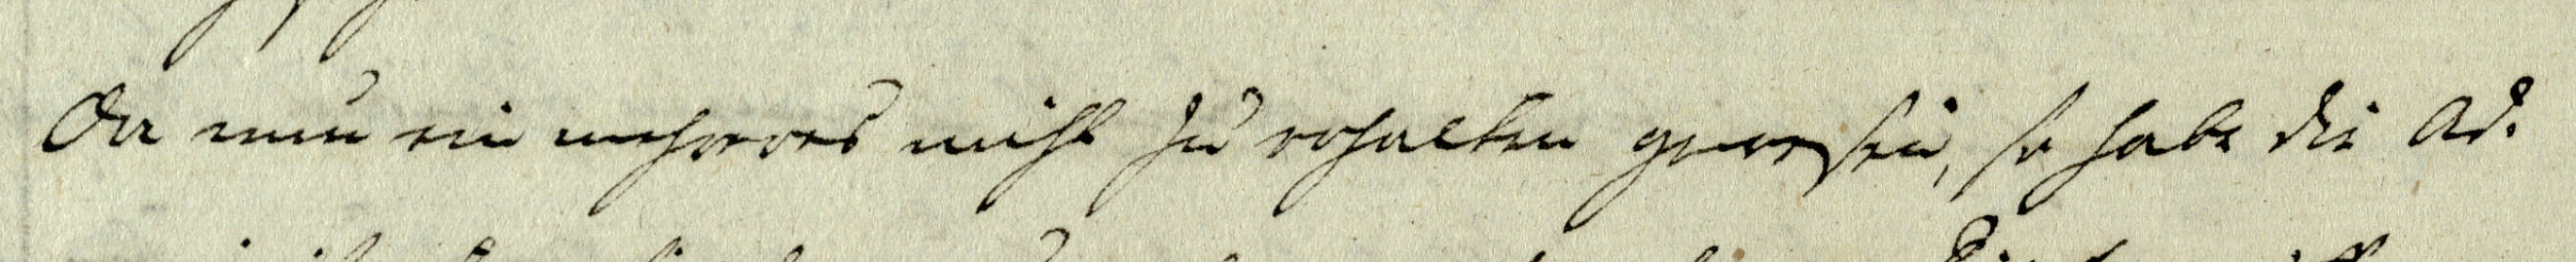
Da nun ein mehreres nicht zu erhalten gewesen, so habe die Ad¬
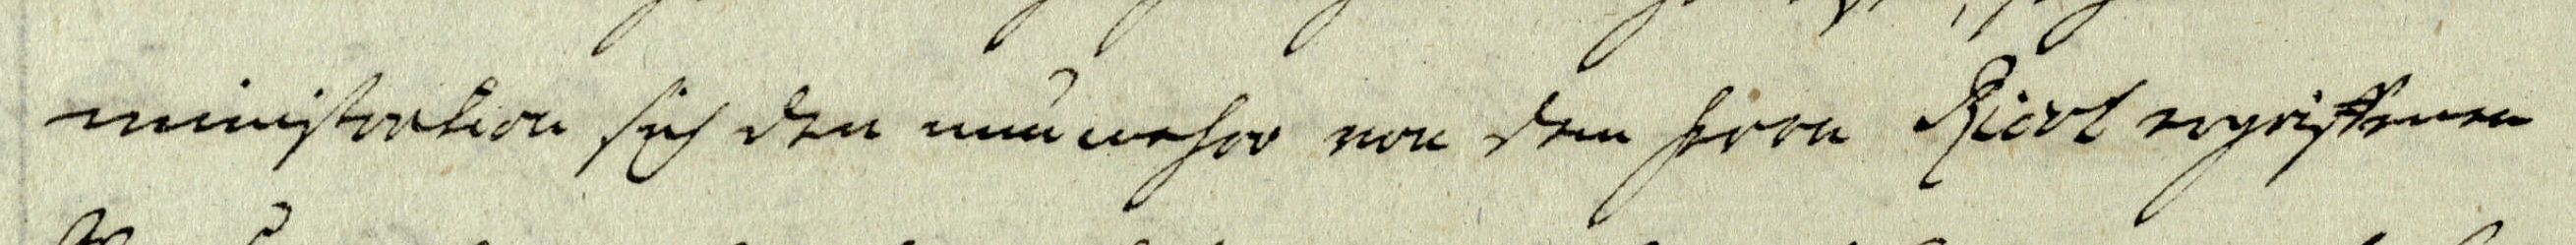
ministration sich den nunmehro von dem Herrn Ricot ergriffenen
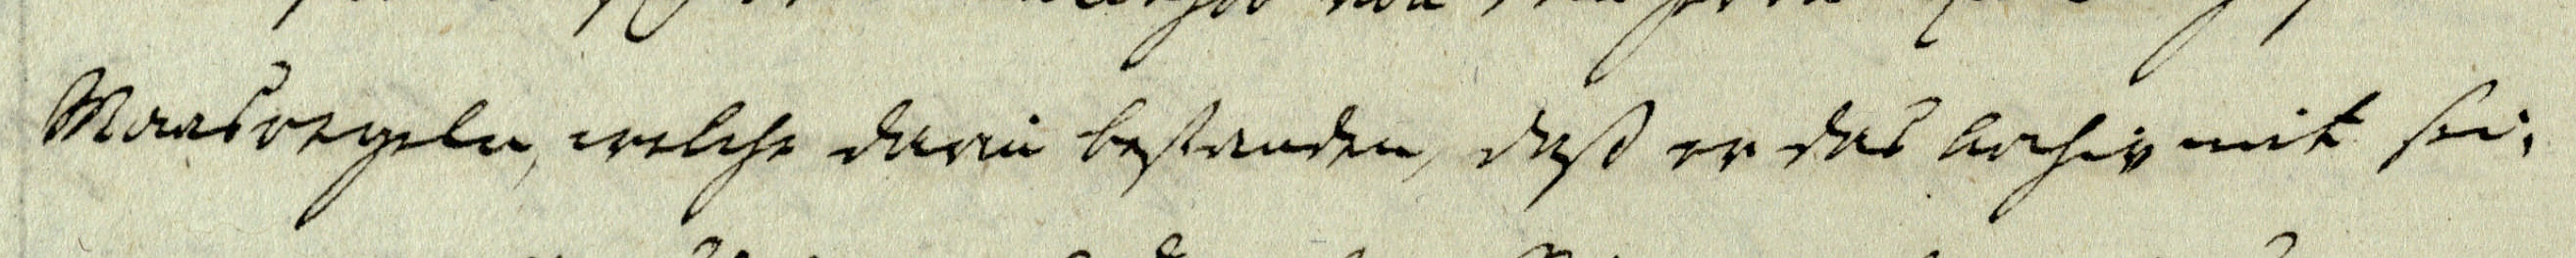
Maasregeln, welche darin bestanden, daß er das Archiv mit sei¬
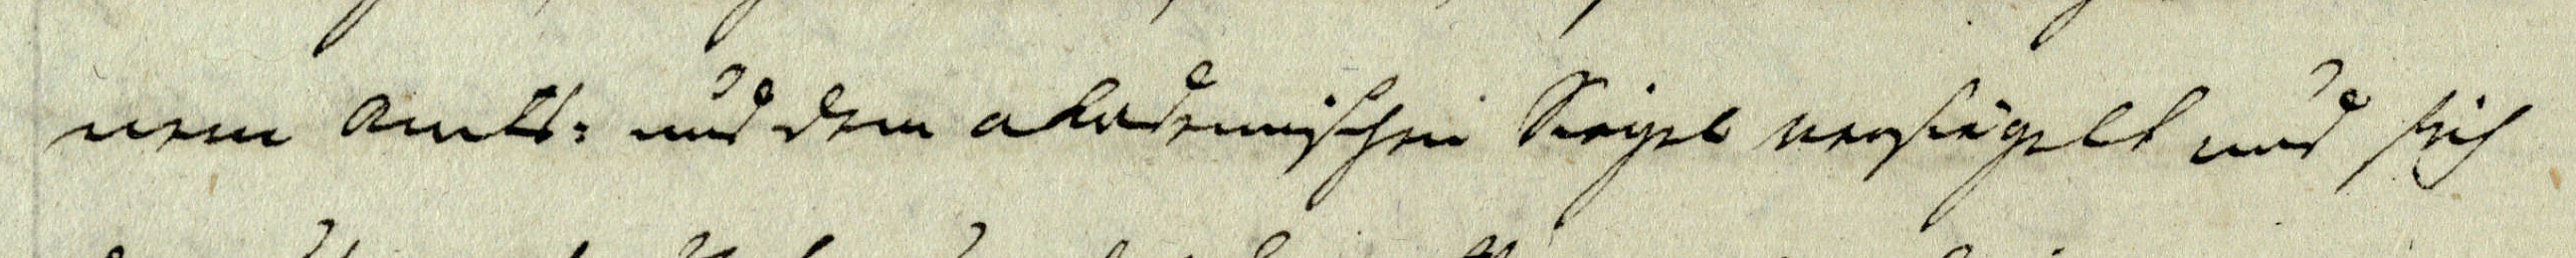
nem Amts- und dem akademischen Siegel versiegelt und sich
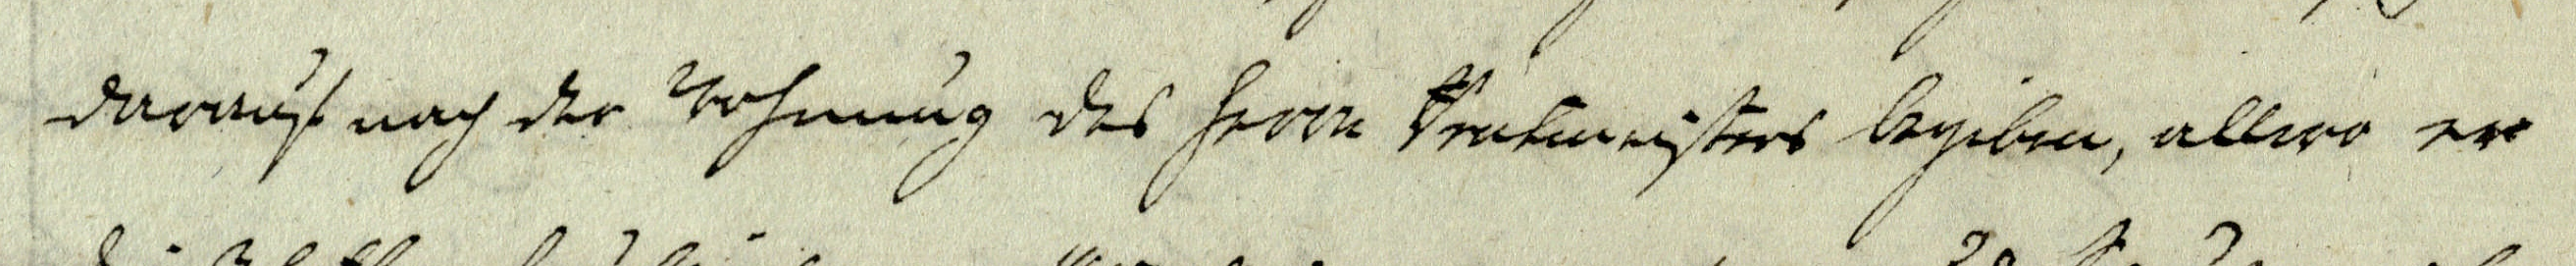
darauf nach der Wohnung des Herrn Rentmeisters begeben, allwo er
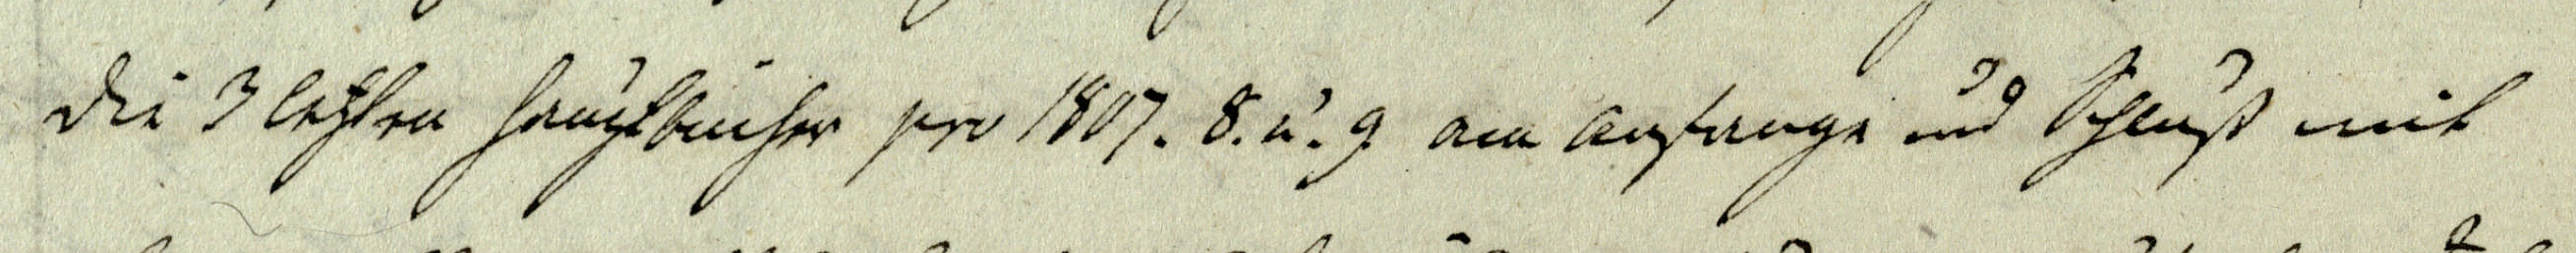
die 3 letzten Hauptbücher pro 1807. 8. u. 9. am Anfange und Schluß mit
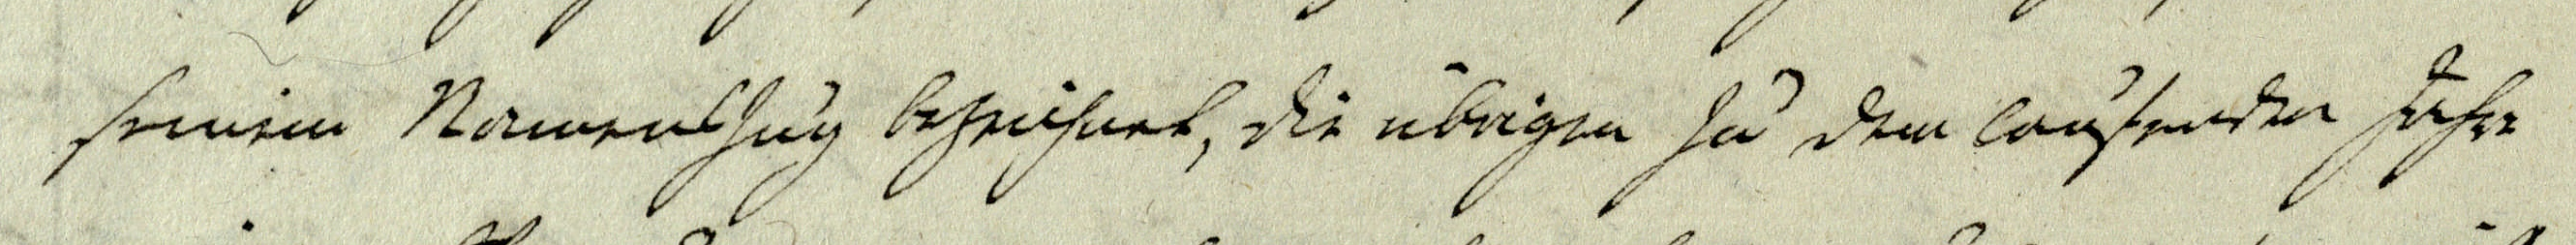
seinem Namenszug bezeichnet, die übrigen zu dem laufenden Jahre
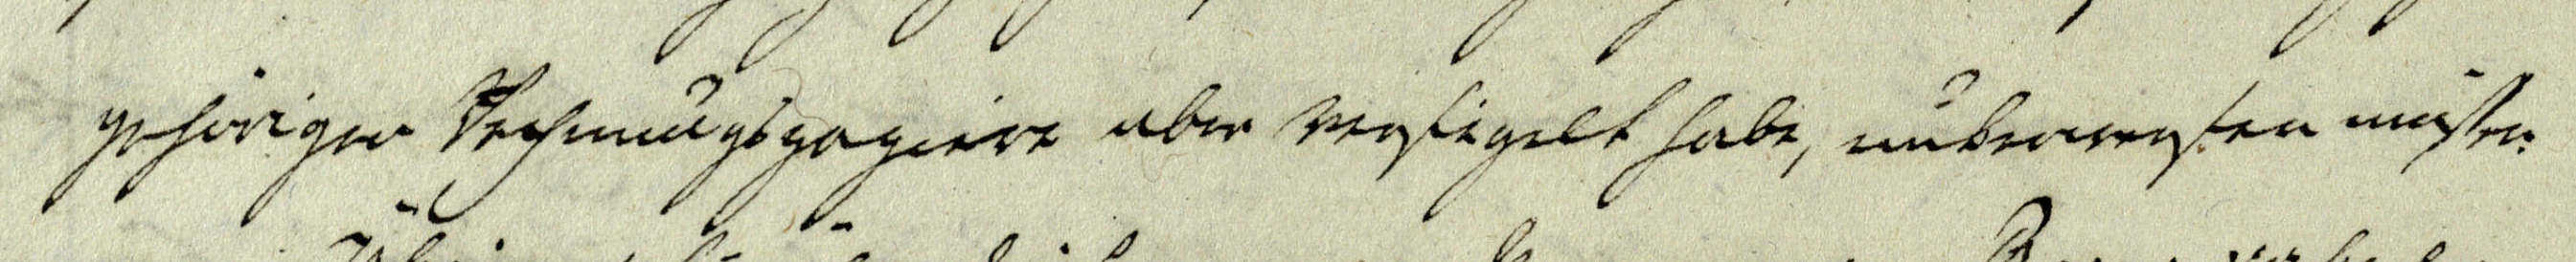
gehörigen Rechnungspapiere aber versiegelt habe, unterwerfen müssen.
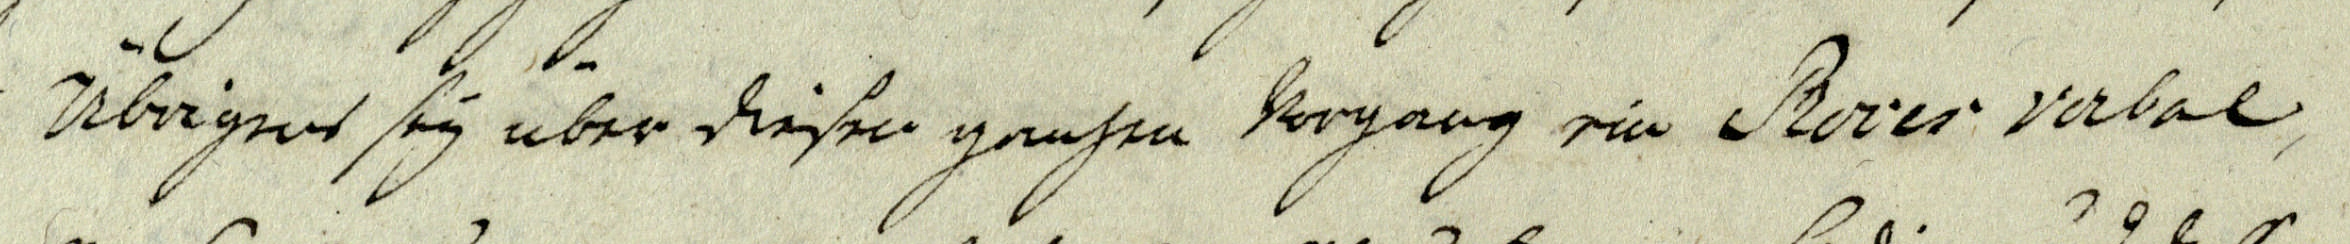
Übrigens seÿ über diesen ganzen Vorgang ein Proces verbal
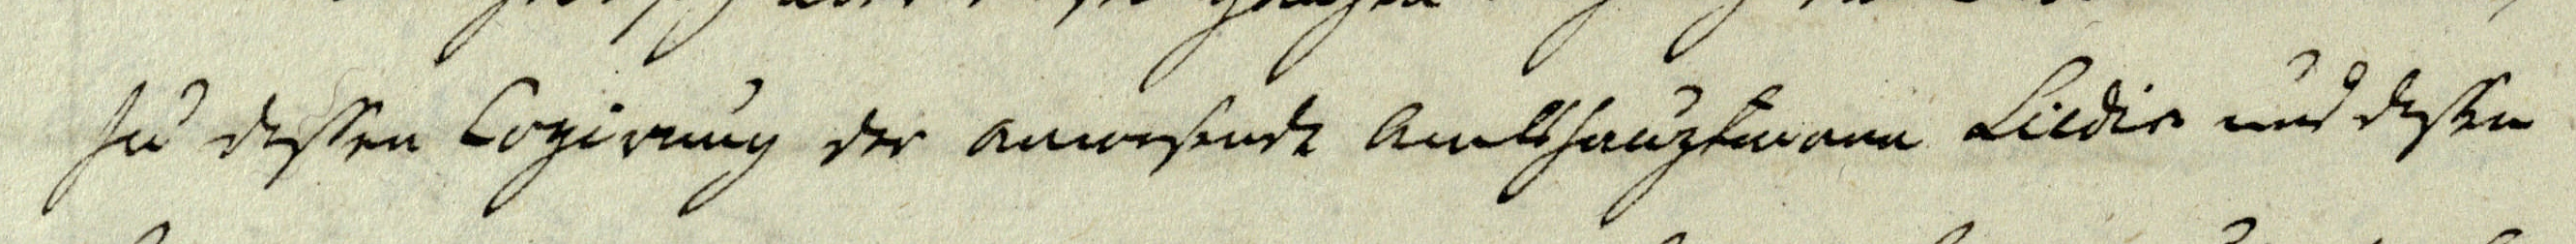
zu dessen Copirung der Anwesende Amtshauptmann Liedin und dessen
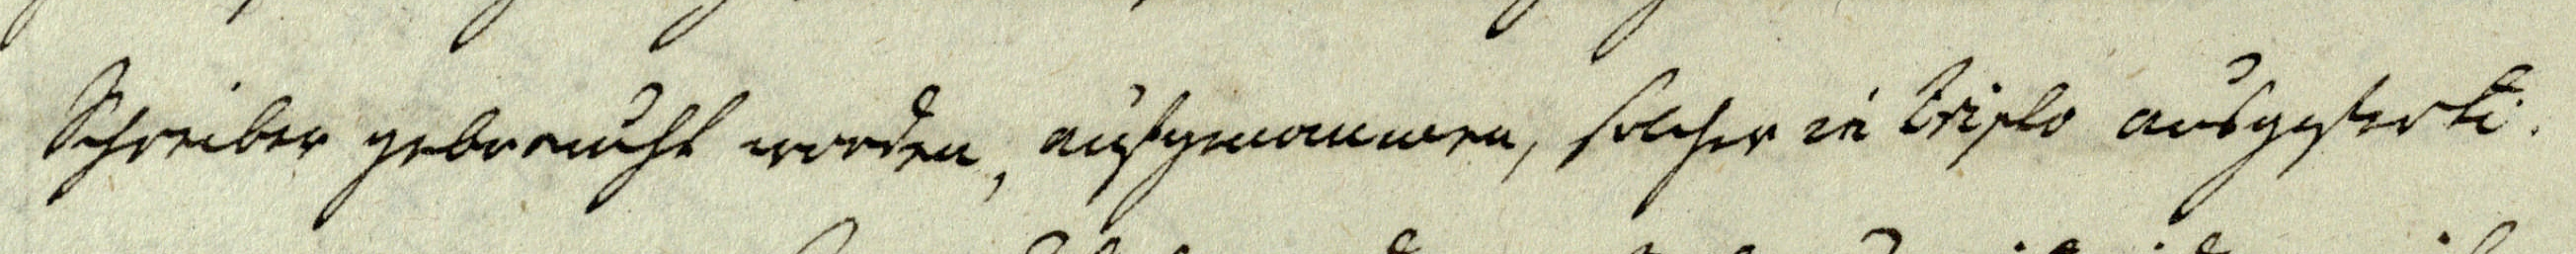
Schreiber gebraucht worden, aufgenommen, solcher in triplo ausgeferti¬
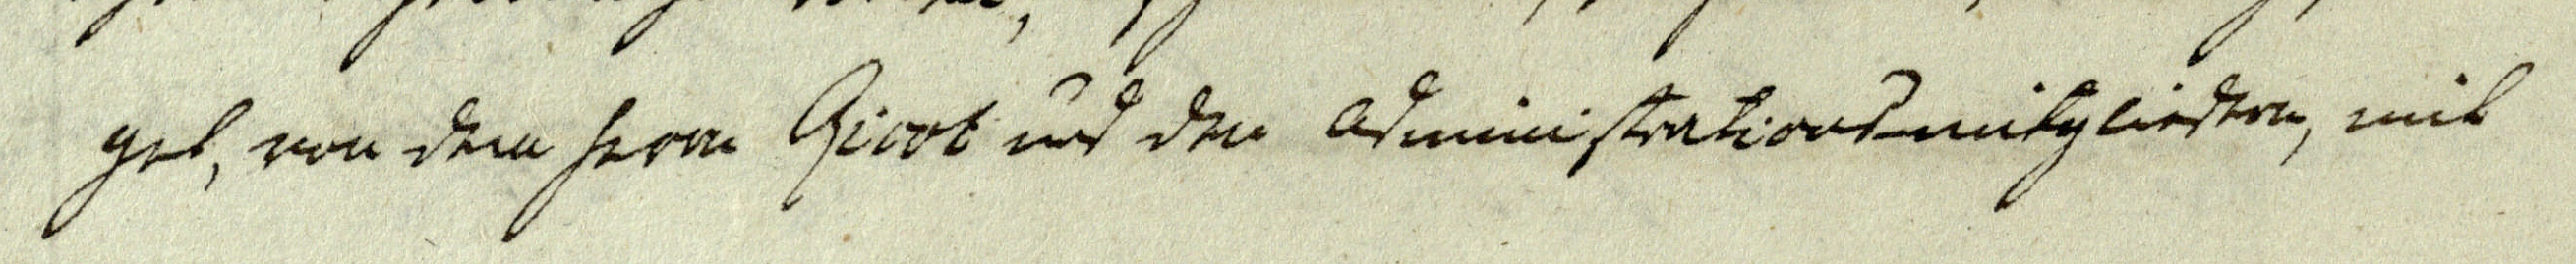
get, von dem Herrn Ricot und den Administrationsmitgliedern, mit
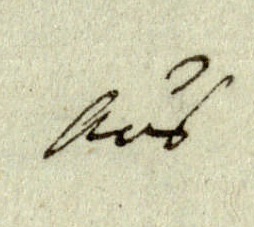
Aus
